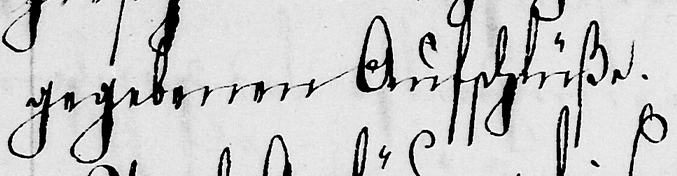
gegebenen Aufschlüße.
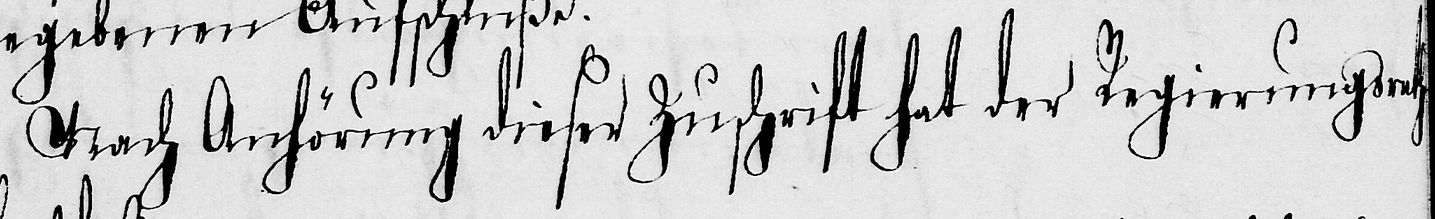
Nach Anhörung dieser Zuschrift hat der Regierungsr¬
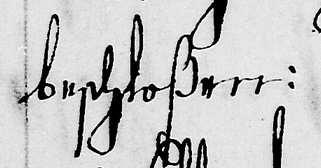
beschloßen:
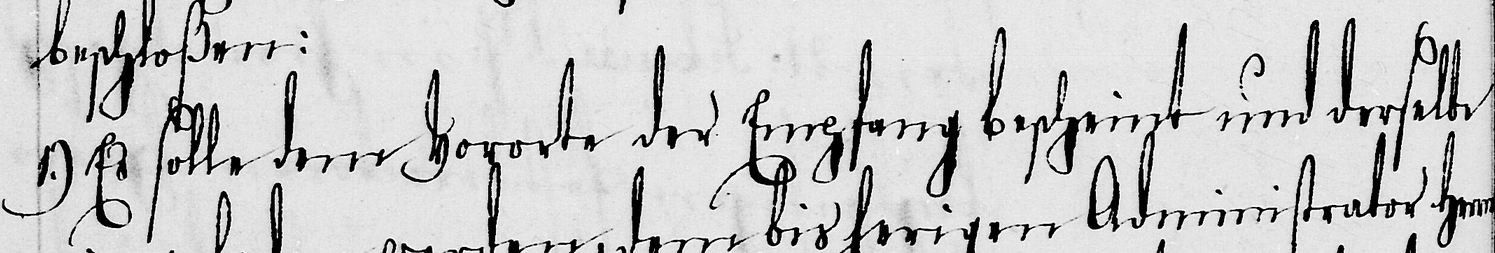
Es solle dem Vororte der Empfang bescheint und derse¬
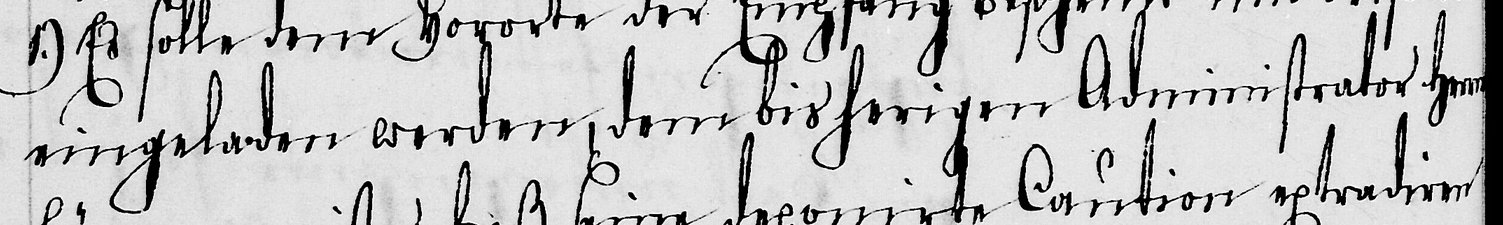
eingeladen werden, dem bisherigen Administrator He¬
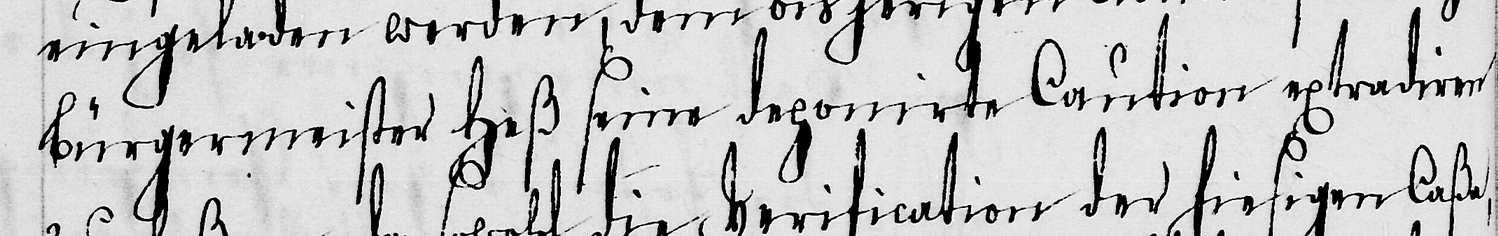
Bürgermeister Heß seine deponirte Caution extradiren
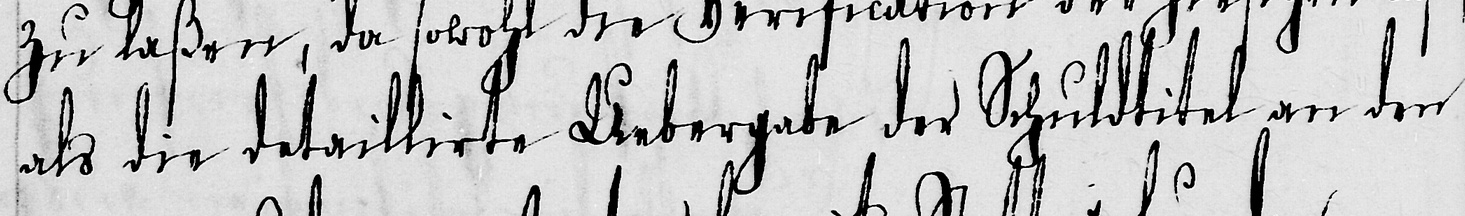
als die detaillierte Uebergabe der Schuldtitel an den
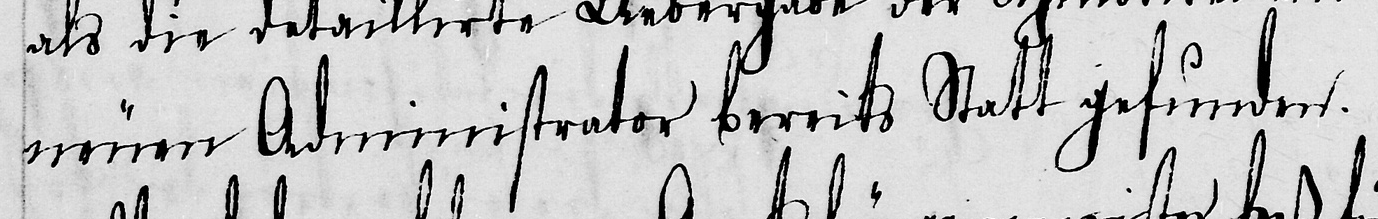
neuen Administrator bereits Statt gefunden.
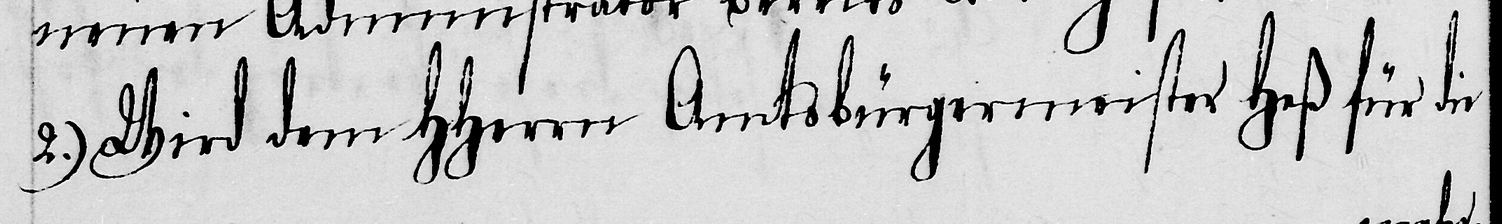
2.) Wird dem HHerrn Amtsbürgermeister Heß für die
